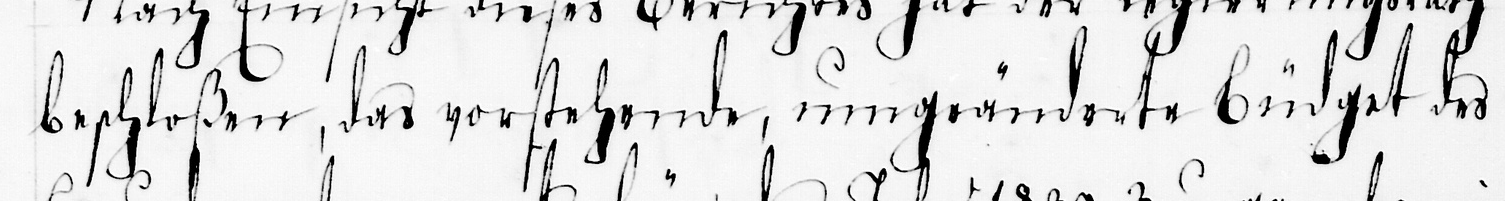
beschloßen, das vorstehende, umgeänderte Büdget des
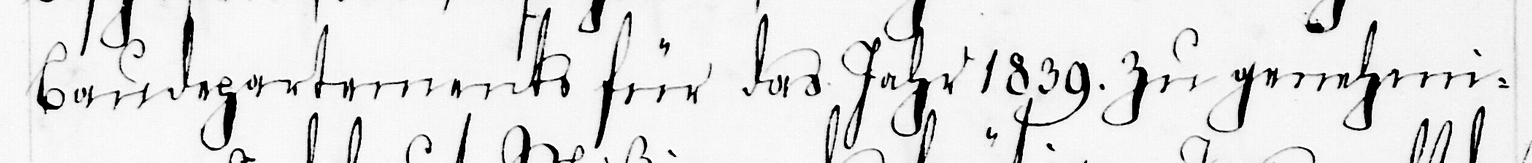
Baudepartements für das Jahr 1839. zu genehmi¬
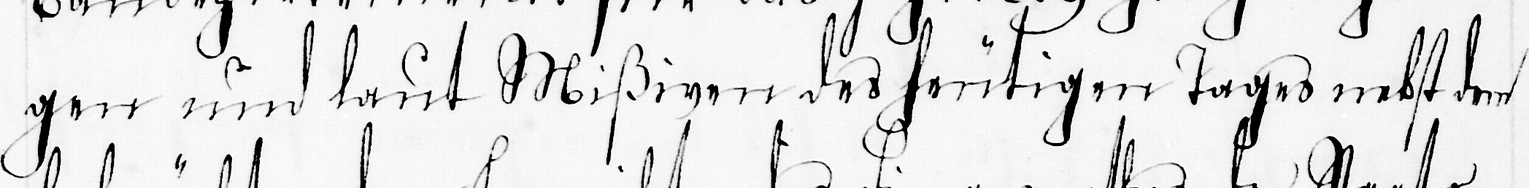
gen und laut Mißiven des heutigen Tages nebst dem
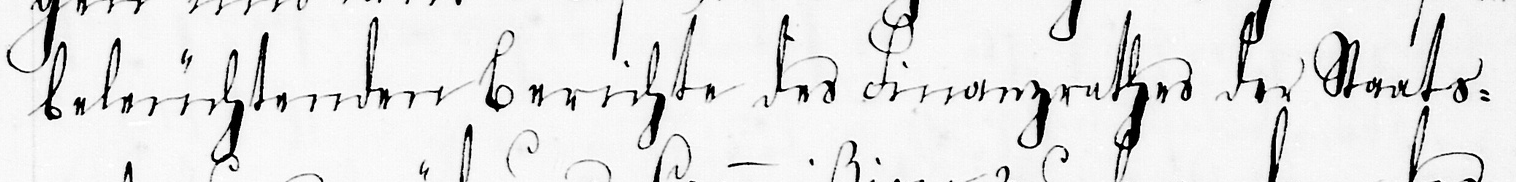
beleuchtenden Berichte des Finanzrathes der Staats¬
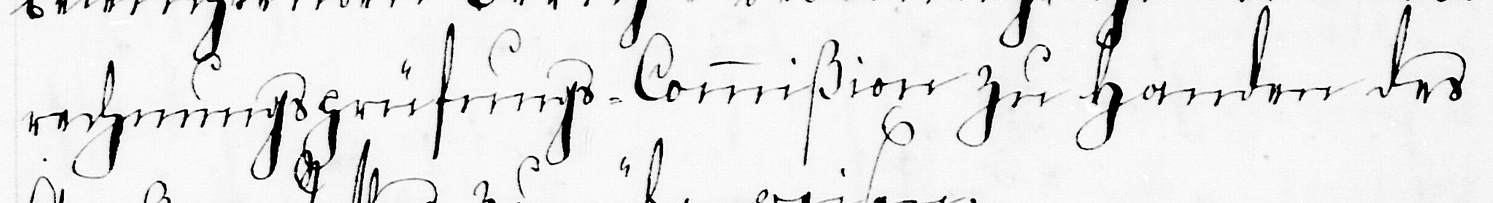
rechnungsprüfungs-Commißion zu Handen des
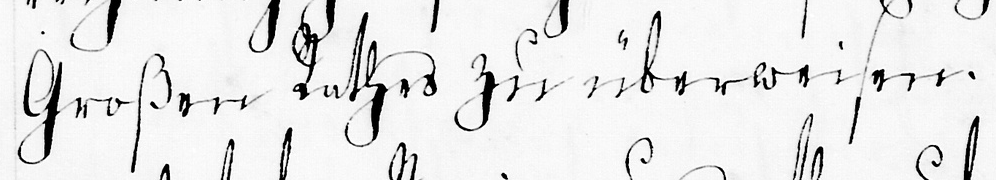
Großen Rathes zu überweisen.
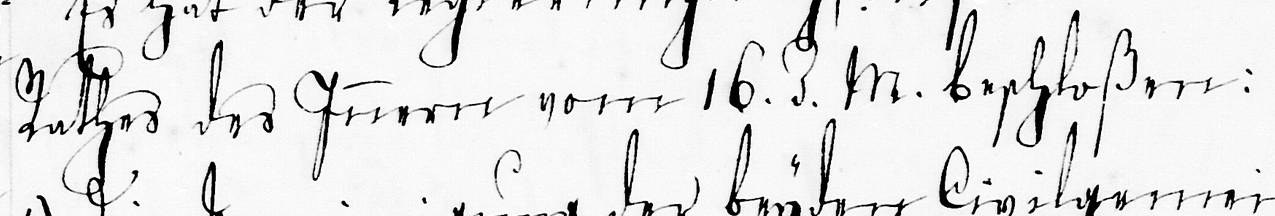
Rathes des Innern vom 16. d. M. beschloßen:
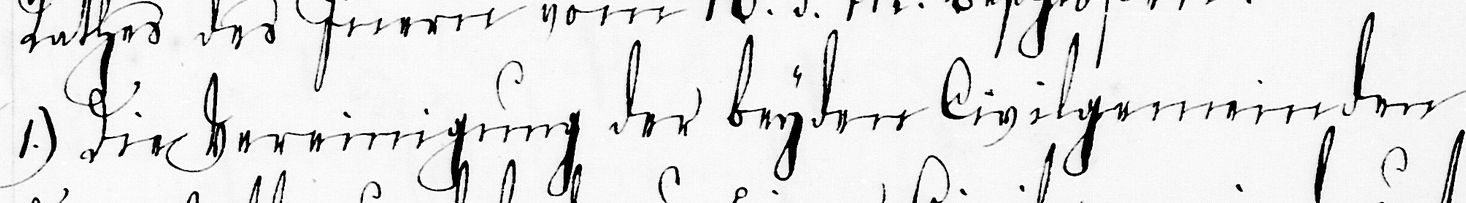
1.) Die Vereinigung der beyden Civilgemeinden
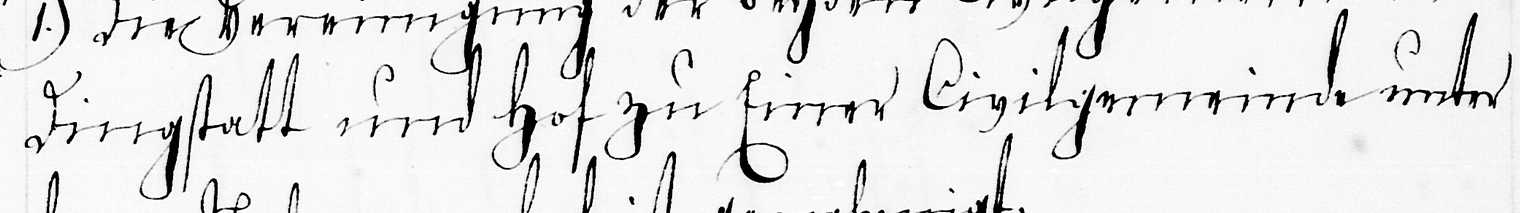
Dingstatt und Hof zu Einer Civilgemeinde unter
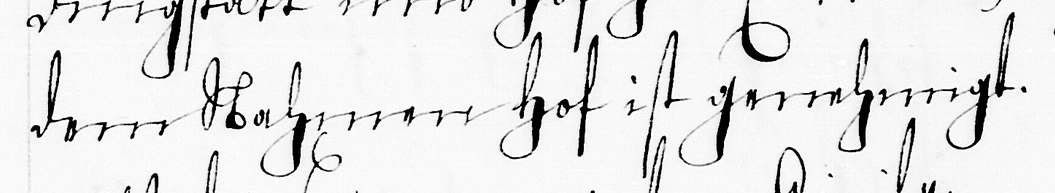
dem Nahmen Hof ist genehmigt.
